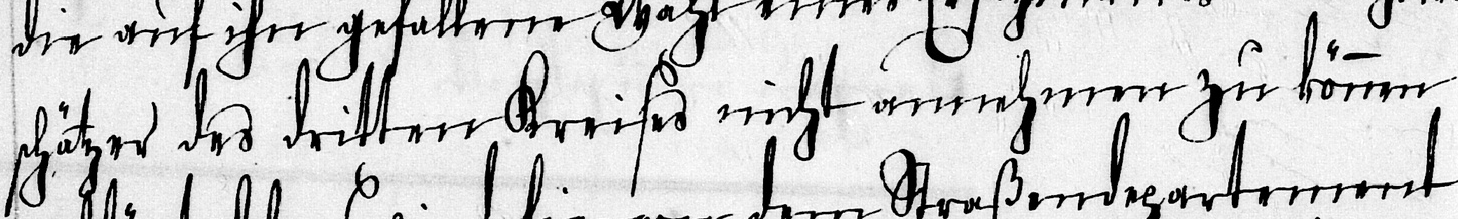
schätzer des dritten Kreises nicht annehmen zu können
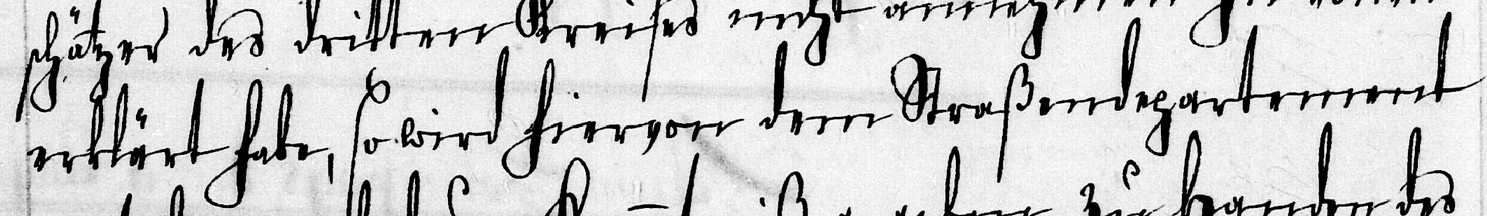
erklärt habe, so wird hiervon dem Straßendepartement
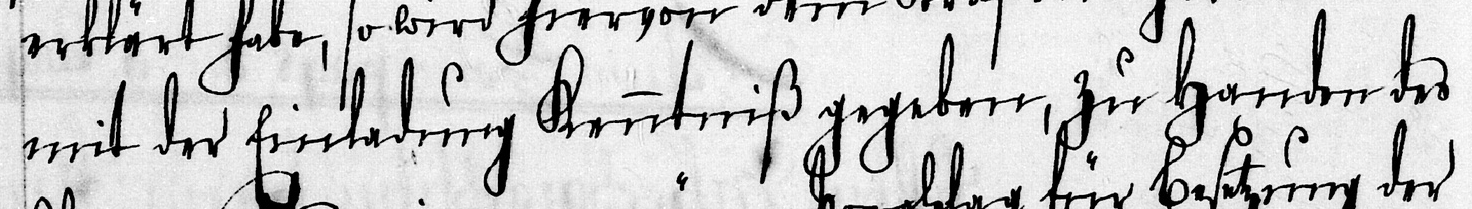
mit der Einladung Kenntniß gegeben, zu Handen des
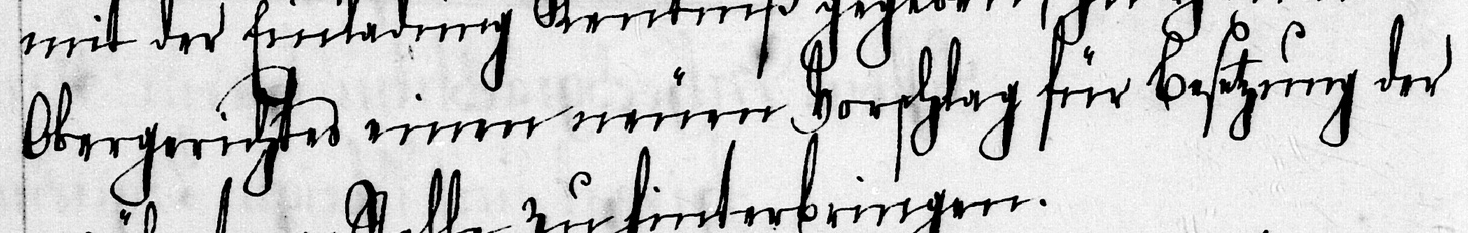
Obergerichtes einen neuen Vorschlag für Besetzung der
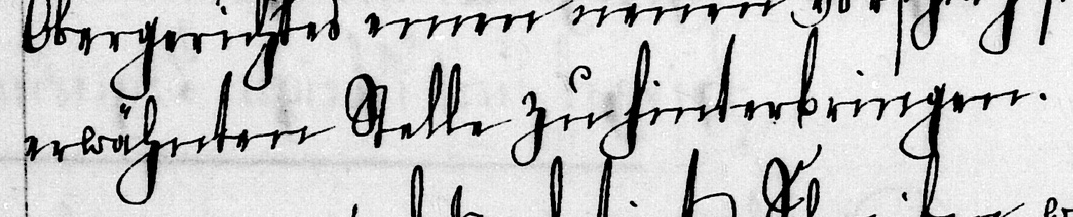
erwähnten Stelle zu hinterbringen.
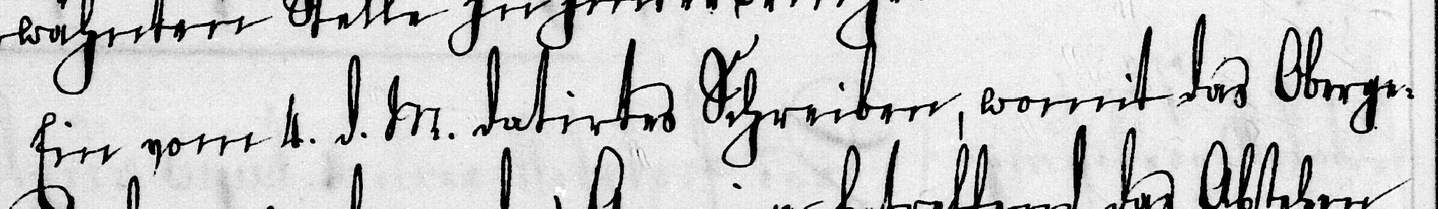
Ein vom 4. d. M. datirtes Schreiben, womit das Oberge¬
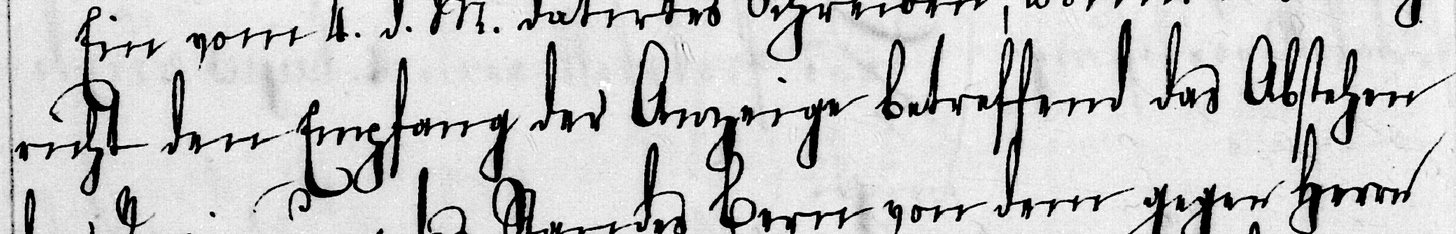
richt den Empfang der Anzeige betreffend das Abstehen
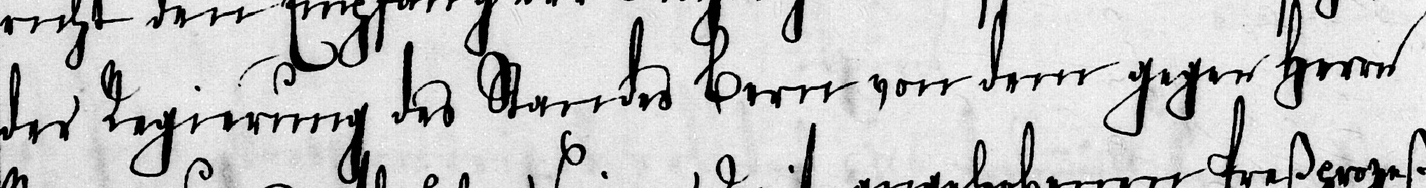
der Regierung des Standes Bern von dem gegen Herrn
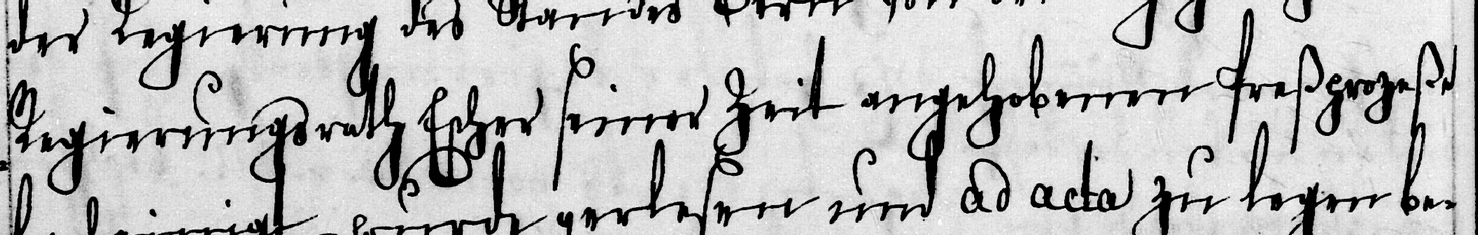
Regierungsrath Escher seiner Zeit angehobenen Preßprozeße
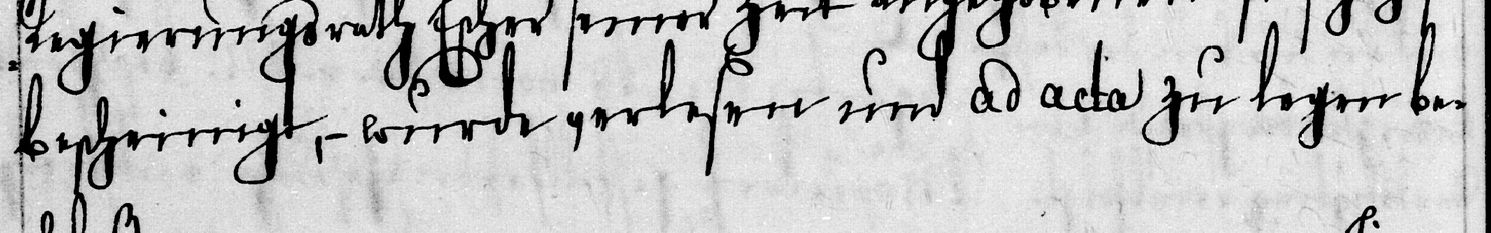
bescheinigt, – wurde verlesen und ad acta zu legen bes¬
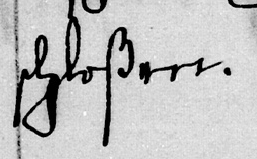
chloßen.
